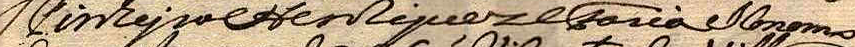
Pinhejro Henriquez e Faria Iconomo
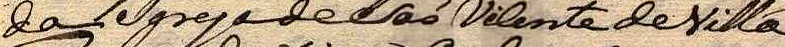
da Igreja de Saõ Vicente de Villa
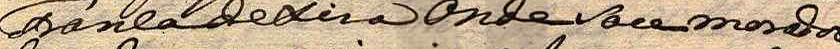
Franca de Xira Onde sou morador
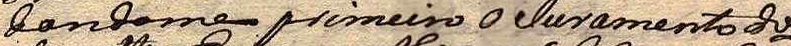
dandome primeiro o Iuramento doz
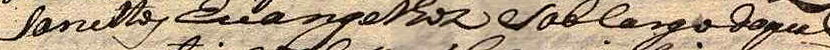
Sancttos Euangelhoz Sob cargo do qual
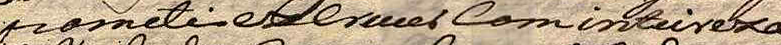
prometi ezcreuer Com inteireza
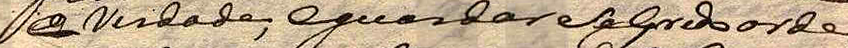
e Verdade, e guardar segredo orde
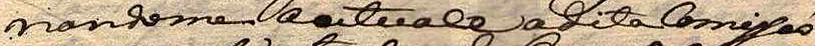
nandome autuace a dita Comissaõ,
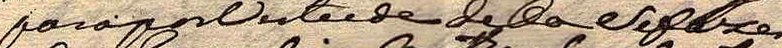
para por Vertude della se fazer
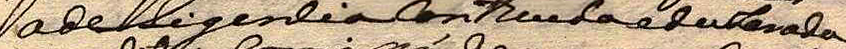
a deligencia contheuda e declarada
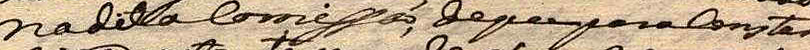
na dita comissaõ, de que para constar
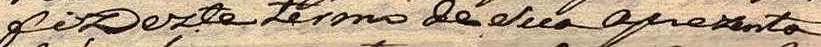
fiz ezte termo de sua aprezenta
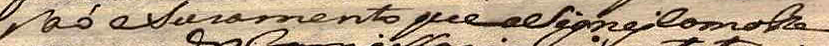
saõ e Iuramento que asignej Com o Re
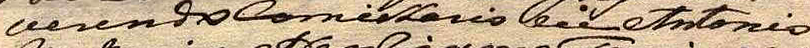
verendo Comissario eu Antonio
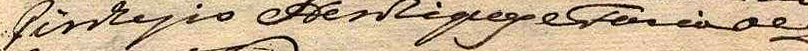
Pinhejro Henriques e Faria o ez
